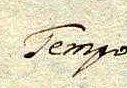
Tempo
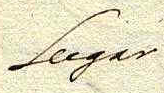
Lugar
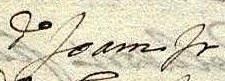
do Joam Jr
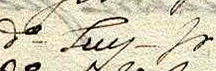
do Luis Jr
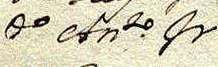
do An.to Jr
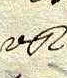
o R
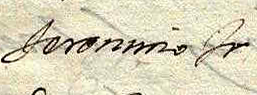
Jeronimo Jr
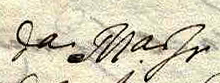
da Ma. Jr
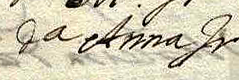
da Anna Jr
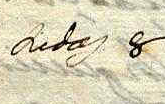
ditos 8
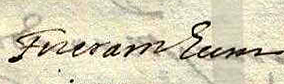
Fizeram hum
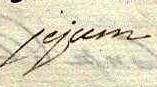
jejum
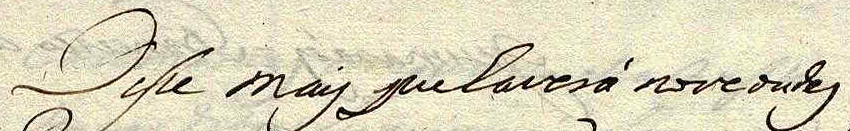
Disse mais que haverá nove ou dez
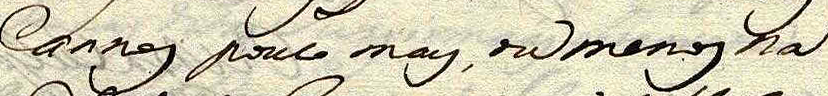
annos pouco mais, ou menos na
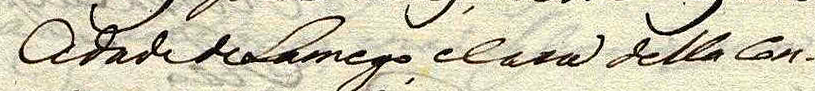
Cidade de Lamego, e Caza della con
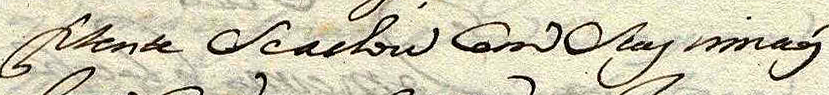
fitente se achou Com seus irmaõs
